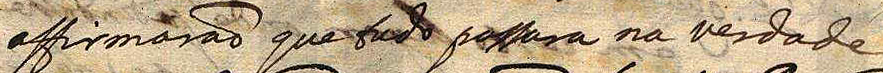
affirmarão que tudo passara na verdade
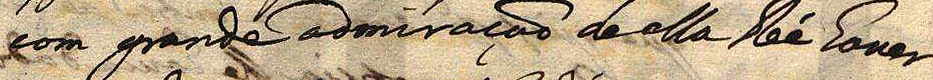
com grande admiração de ella Reé hauer
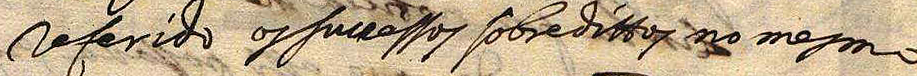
referido os successos sobredittos no mesmo
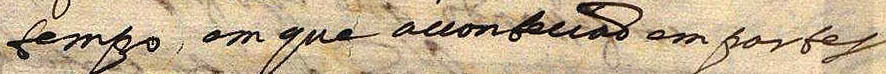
tempo, em que acconteciaõ em partes
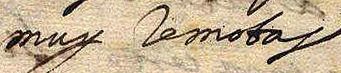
muy Remotas
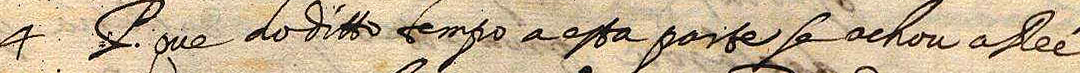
4 P. que do ditto tempo a esta parte se achou a Reé
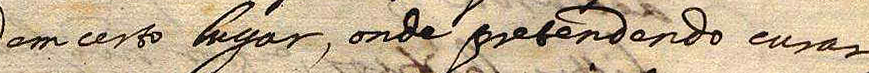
em certo lugar, onde pretendendo curar
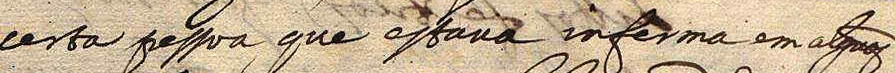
certa pessoa que estaua inferma em algūas
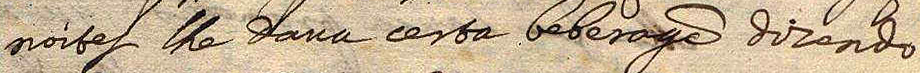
noites lhe daua certa beberagē dizendo
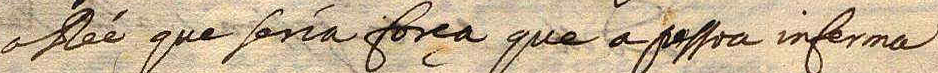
a Reé que seria força que a pessoa inferma
